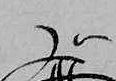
ta
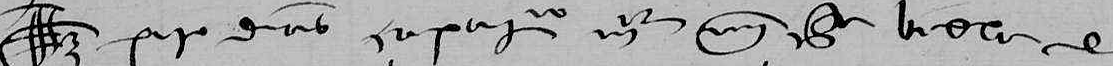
Jtem pero dias çapatro mor em esta villa de
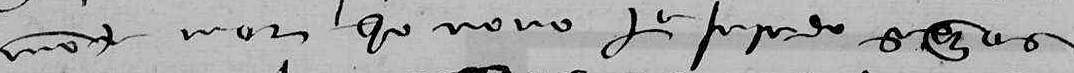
mōtemor ho nouo ta Jurado sob̄r os
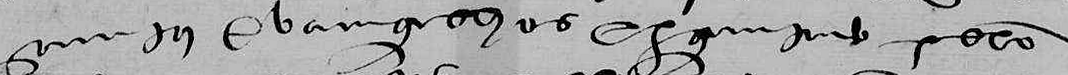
samtꝯ evamgelhos e ꝑguntado pll̄o
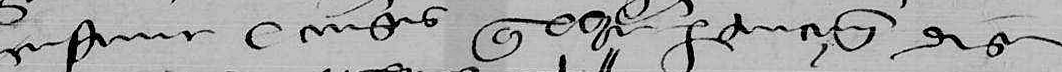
custume e cousas q̄ lhe ꝑtençem dise
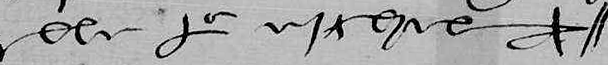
elle ta njchel
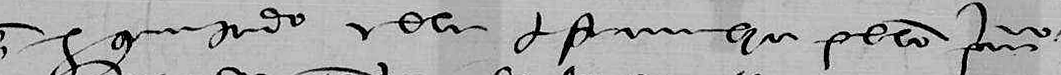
item ꝑguntado elle testemunha pll̄o pimro
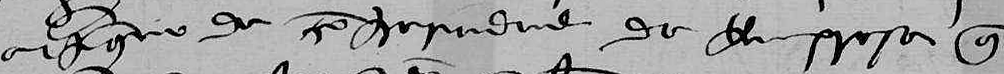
artiguo da c̄otrariadade da Ree presa q̄
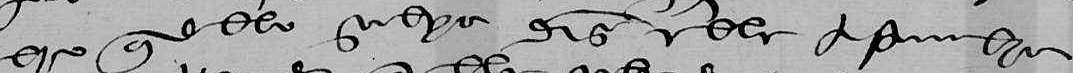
ho q̄ dello sabya dise elle testemunha
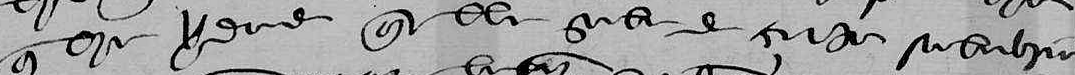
q̄ he ꝟdade q̄ elle sabe de certa sabedoria
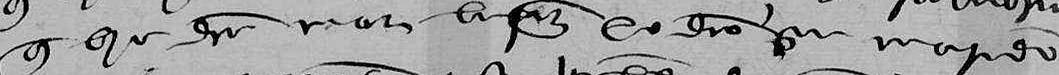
q̄ ha dīa mor lopez e o dīo seu marido
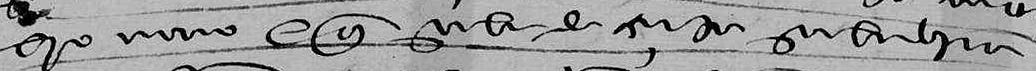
ho nouo e q̄ sabe de certa sabedoria
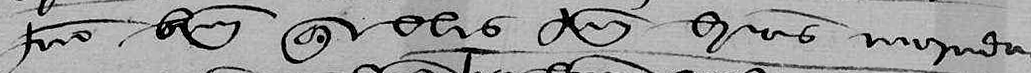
tãobem q̄ elles tem huās moradas
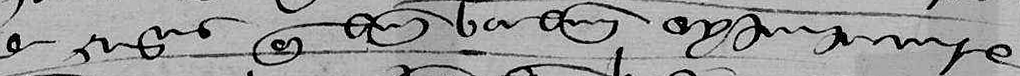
de casas q̄ bem valem oytenta mjl
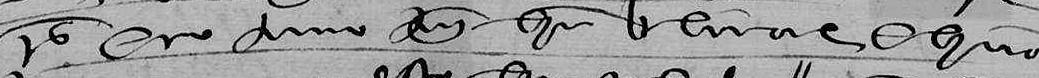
r̄s e no termo tem hū vliual e huā
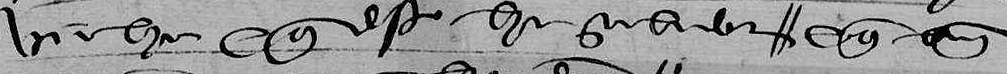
vinha e q̄ desto he sabedor // e q̄ bem
